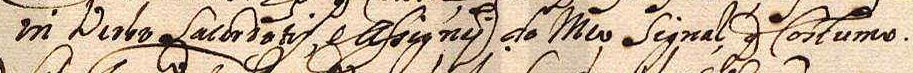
in Verbo Sacerdotis, e assignej do meo signal, q̄ Costumo.
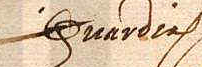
Guardiaõ
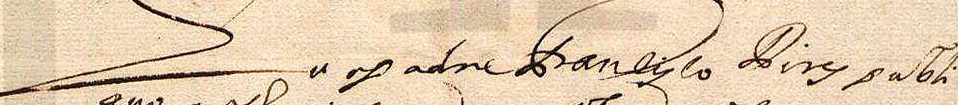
Eu o padre Francisco Pires publi
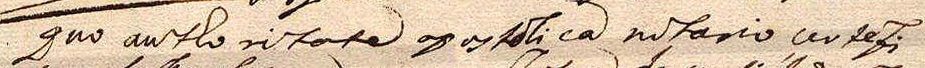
quo authoritate apostolica notario certefi
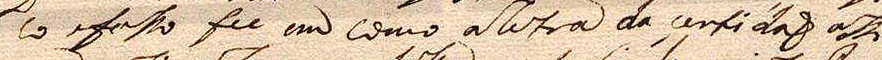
co e fasso fee em como a letra da certidaõ assi
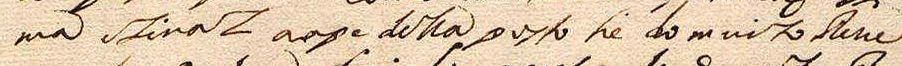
ma e sinal ao pe della posto he do muito Reue
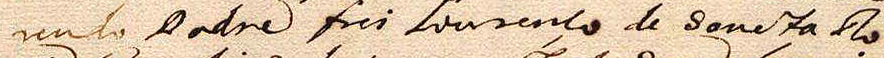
rendo Padre frei Lourenço de Sancta Ro
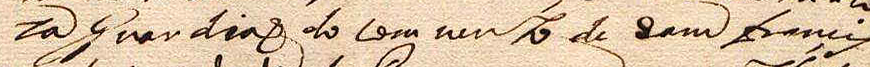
za Guardiaõ do comuento de sam francis
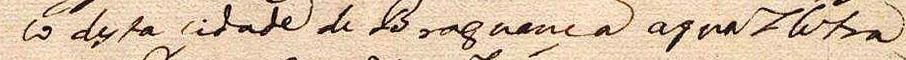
co desta cidade de Braguança a qual letra
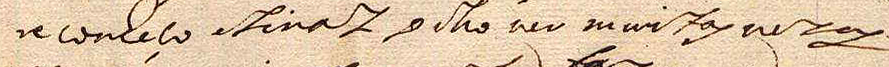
reconheço e sinal pelo uer muitas uezes
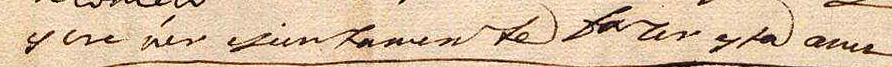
escreuer e juntamente fazer esta a mi
